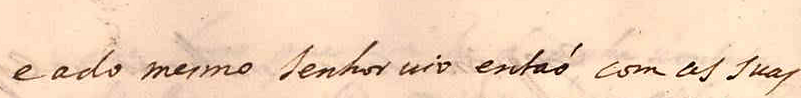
e a do mesmo Senhor uio entaõ com as suas
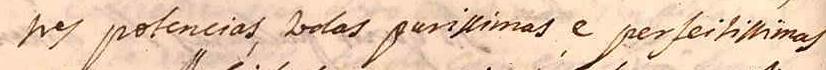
tres potencias, todas purissimas, e perfeitissimas
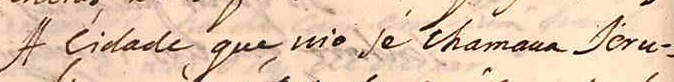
A cidade, que uio se chamaua Ieru
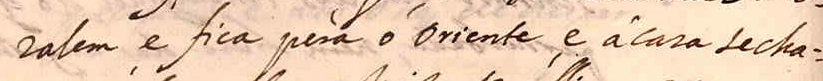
zalem, e fica pera o Oriente, e a caza se cha
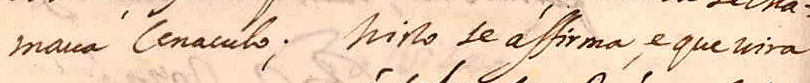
maua Cenaculo; Nisto se affirma, e que uira
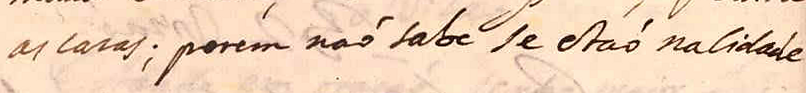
as cazas; porem naõ sabe se estaõ na Cidade
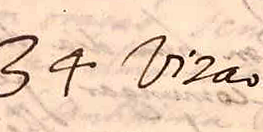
34 Vizaõ
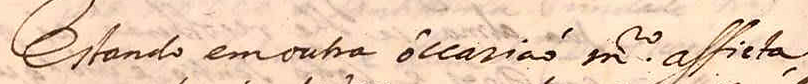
Estando em outra óccaziaõ mto afficta,
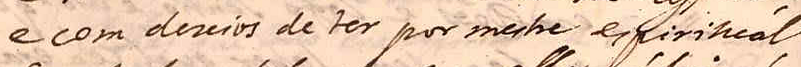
e com dezeios de ter por mestre espiritual,
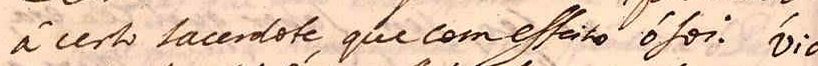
á certo sacerdote, que com effeito ó foi. vio
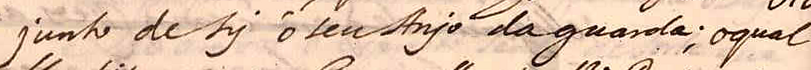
junto de sy ó seu Anjo da guarda; o qual
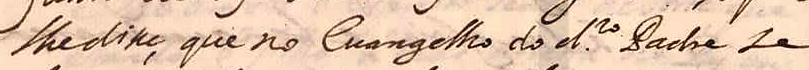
lhe disse, que no Euangelho do d.to Padre se
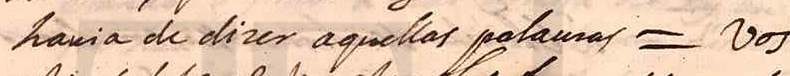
hauia de dizer aquellas palauras = Vos
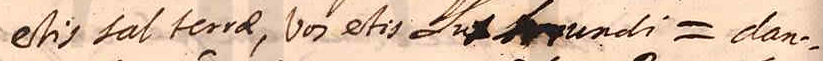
estis sal terræ, vos estis Lux mundi = dan
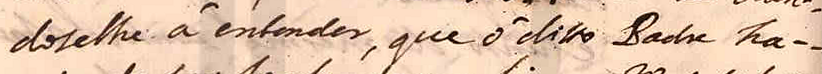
doselhe á entender, que ó ditto Padre ha
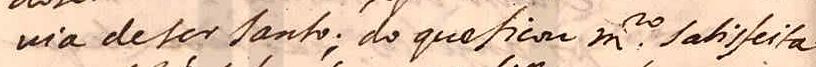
uia de ser Santo, do que ficou m.to satisfeita.
